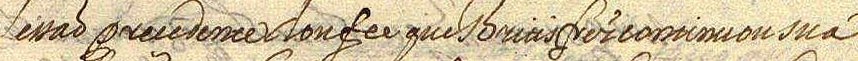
Sessaõ precedente dou fee que Britis frez̄ continuou sua
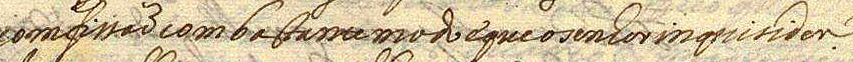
comfissaõ com bastante modo e que o senhor inquisidor
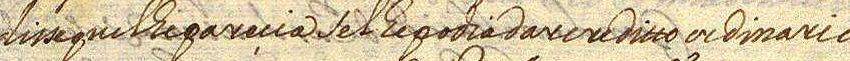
disse que lhe pareçia se lhe podia dar creditto ordinario
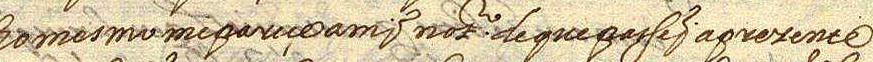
E o mesmo me pareçe a mj̄ not.ro de que passej a prezente
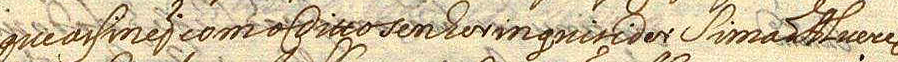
que assinej com o ditto senhor inquisidor Simaõ Alueres
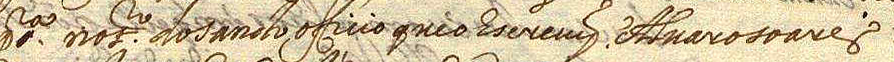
pra. not.ro do sancto officio que o Escreuj. Aluaro soares
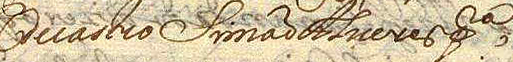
de castro Simaõ Alueres pra
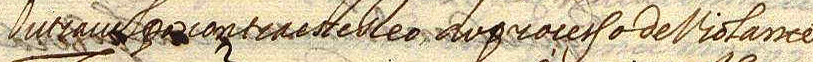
Outra culpa contra este Reo, do proçesso de Violante
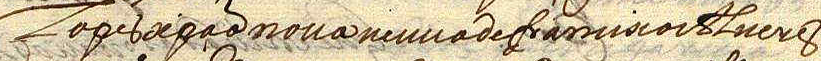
Lopes xpaā noua uiuua de francisco Alueres
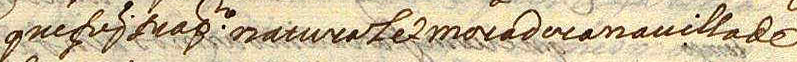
que foj trap.ro natural e moradora na uilla de
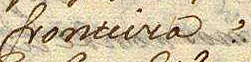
fronteira.
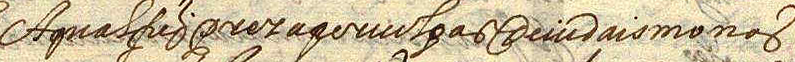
A qual fuj preza per culpas de iudaismo nos
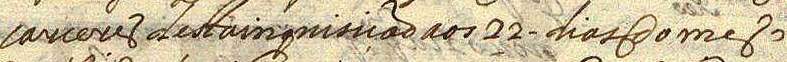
carçeres desta inquisiçaõ aos 22. dias do mes
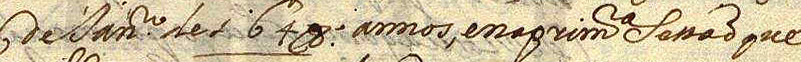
de Ian.ro de i648: annos, e na primra Sessaõ que
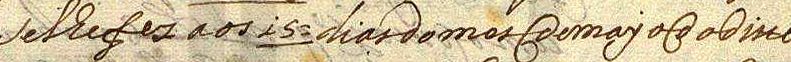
se lhe fez aos i5 = dias do mes de mayo do ditto
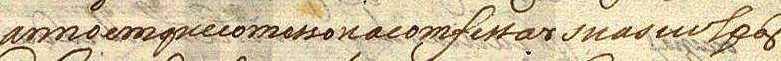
anno em que comessou a comfessar suas culpas
